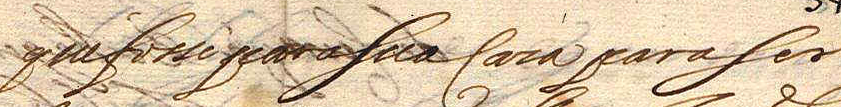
que fosse para sua Caza para ser
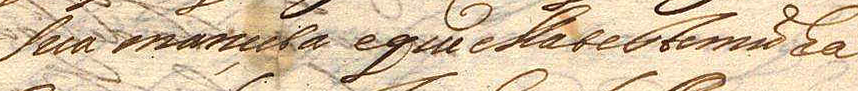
sua manceba e que ella testemūha
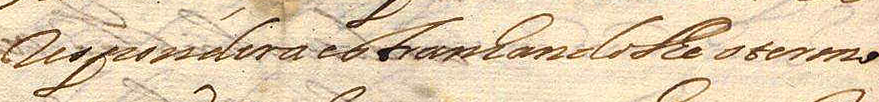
Respondera estranhandolhe o termo
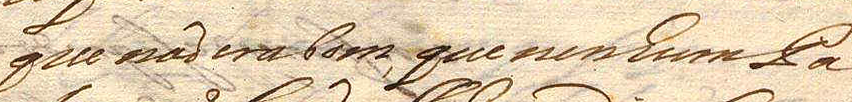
que naõ era bom, que nenhum Pa
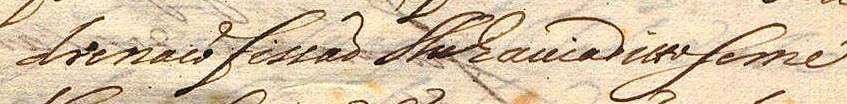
dre na cōfissão lhe hauia ditto seme
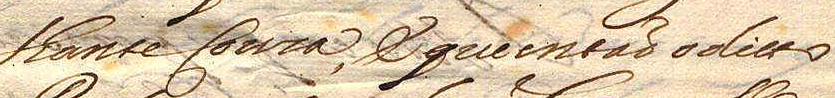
lhante Couza, E que entaõ o ditto
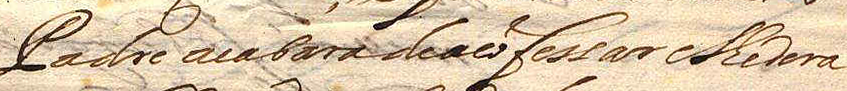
Padre acabara de a cōfessar e lhe dera
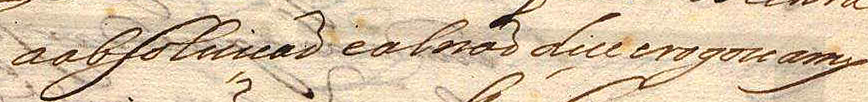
a absoluiçaõ, e al naõ dice, e rogou a my
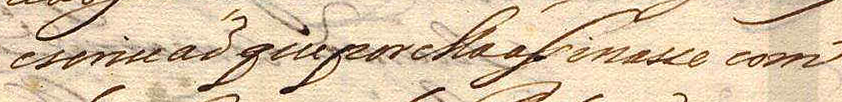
escriuaõ que por ella assinasse com
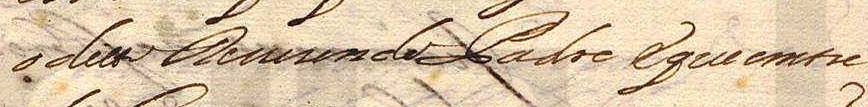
o ditto Reuerendo Padre E que em tu
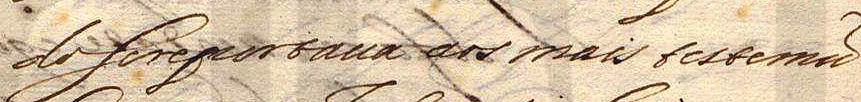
do se reportaua aos mais testemū
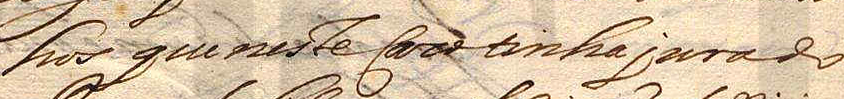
hos que neste Cazo tinha jurado
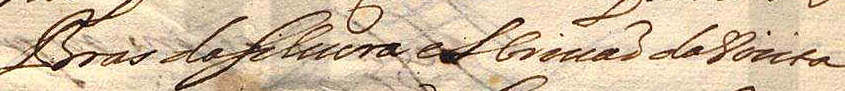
Bras da Silueira escriuaõ da Vizita
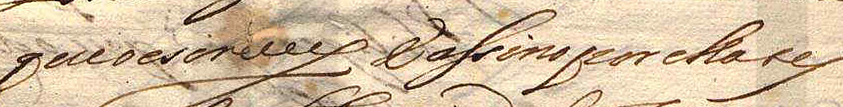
que o escreuy E assino por ella tes
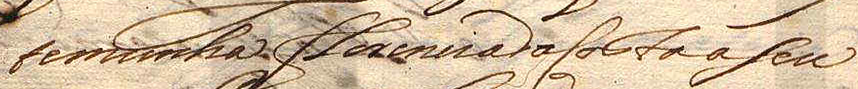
temunha florencia da Costa a seu
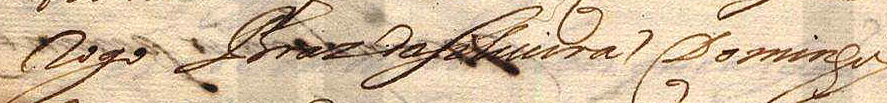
Rogo Braz da Silueira Domingos
